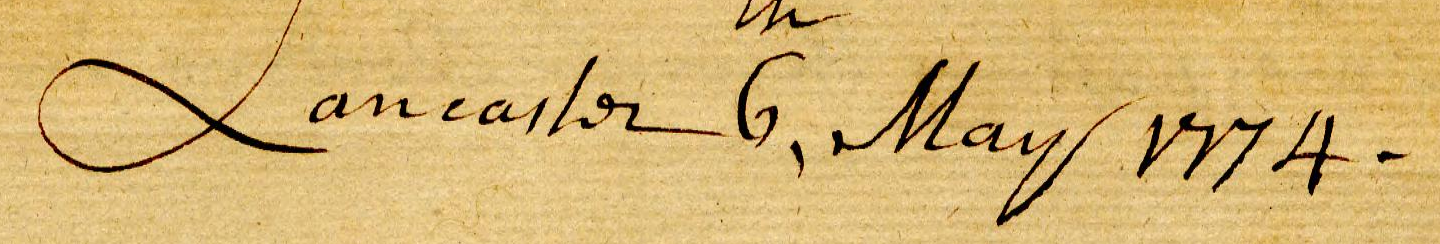Lancaster 6^th, May 1774-
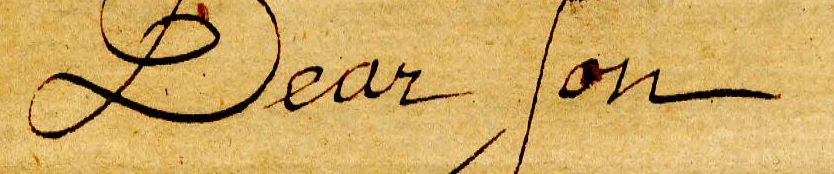Dear Son
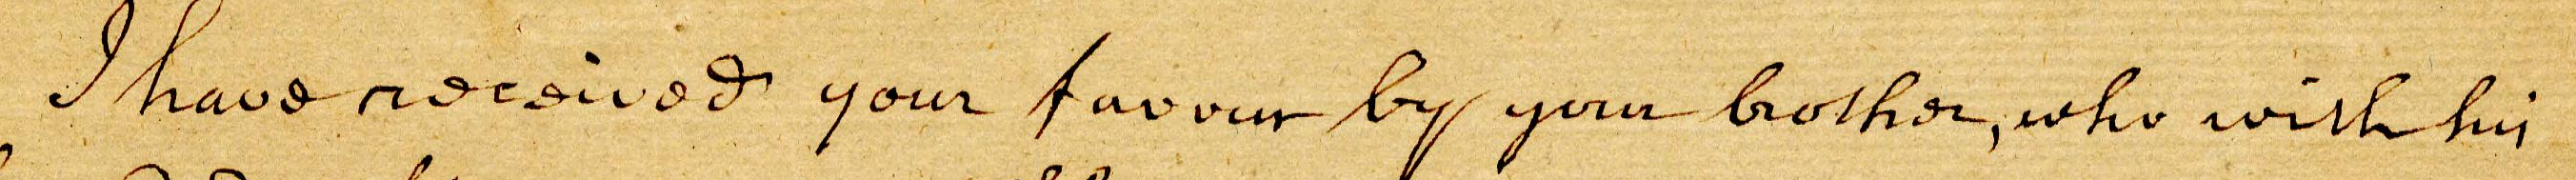I have received your favour by your brother, who with his
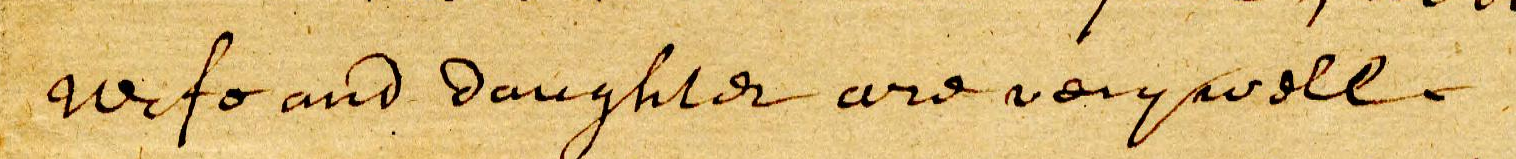wife and daughter are very well.
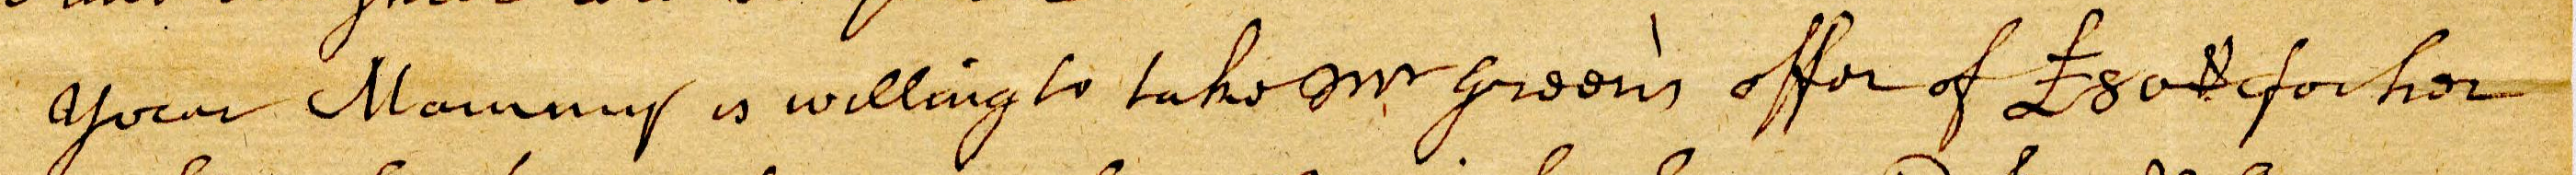Your Mammy is willing to take M^r Green's offer of £8 a lb for her
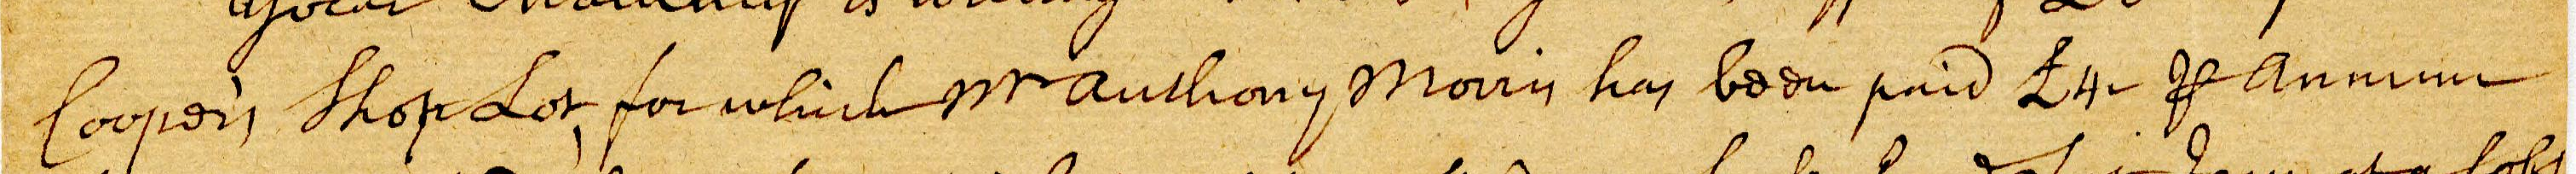Cooper's shop Lot, for which M^r Anthony Morris has been paid £4- per Annum
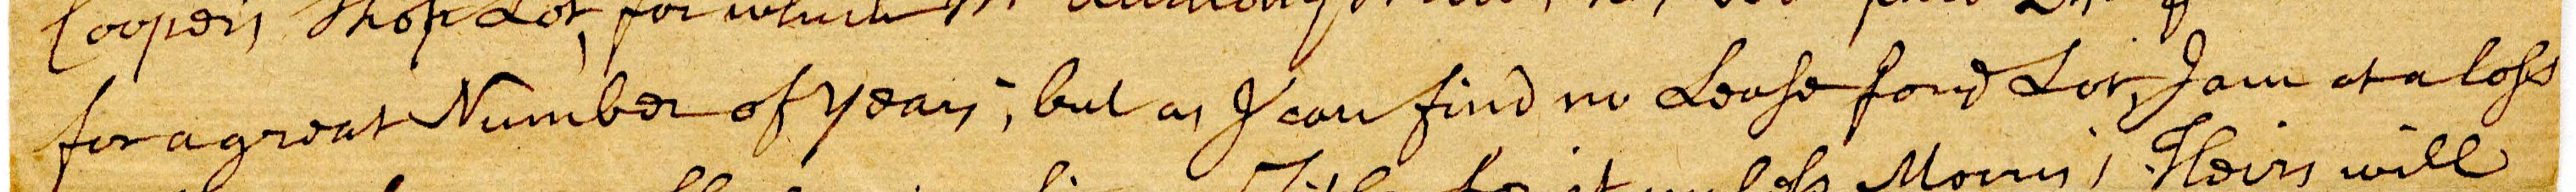for a great Number of years; but as I can find no Lease for y^e Lot, I am at a loss
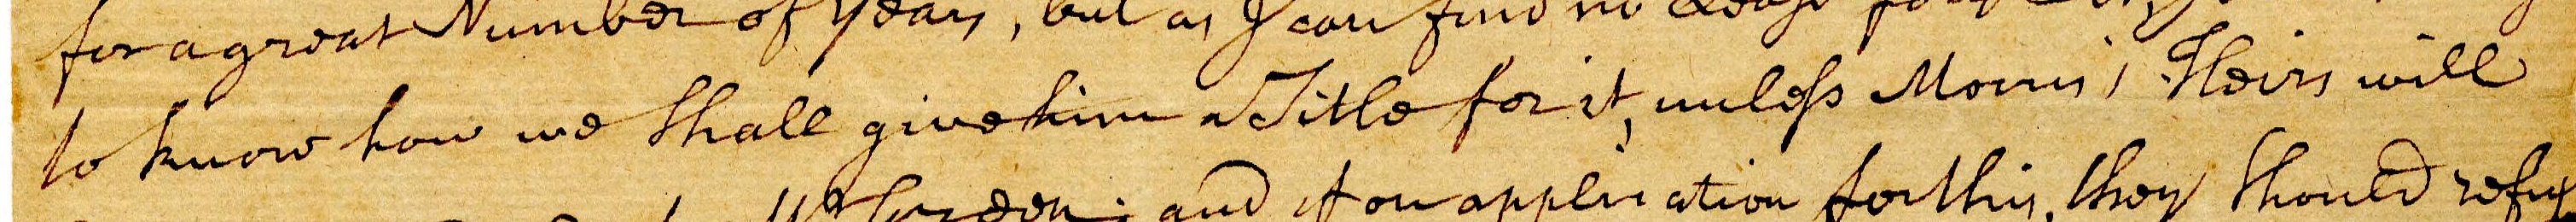to know how we shall give him a Title for it, unless Morris's Heirs will
